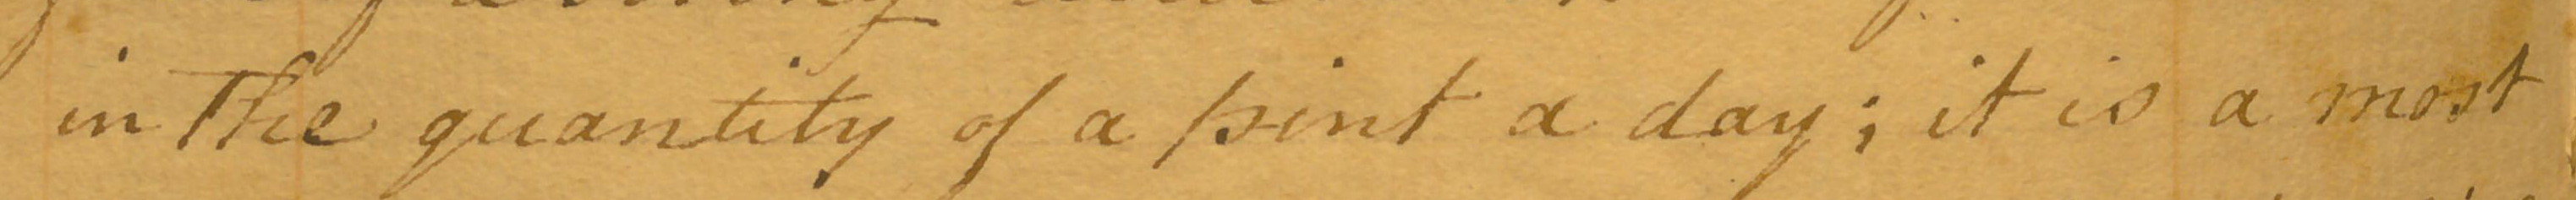in the quantity of a pint a day; it is a most
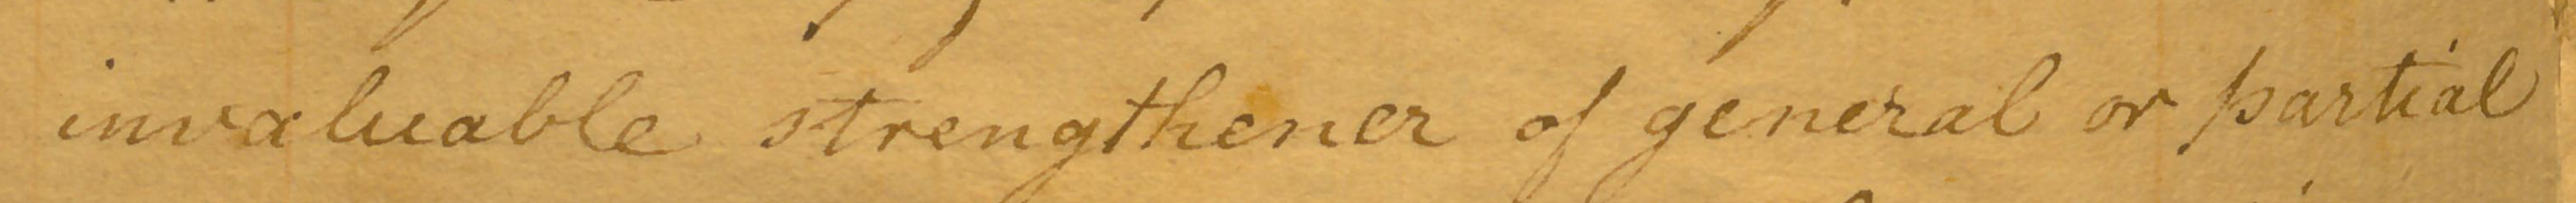invaluable strengthener of general or partial
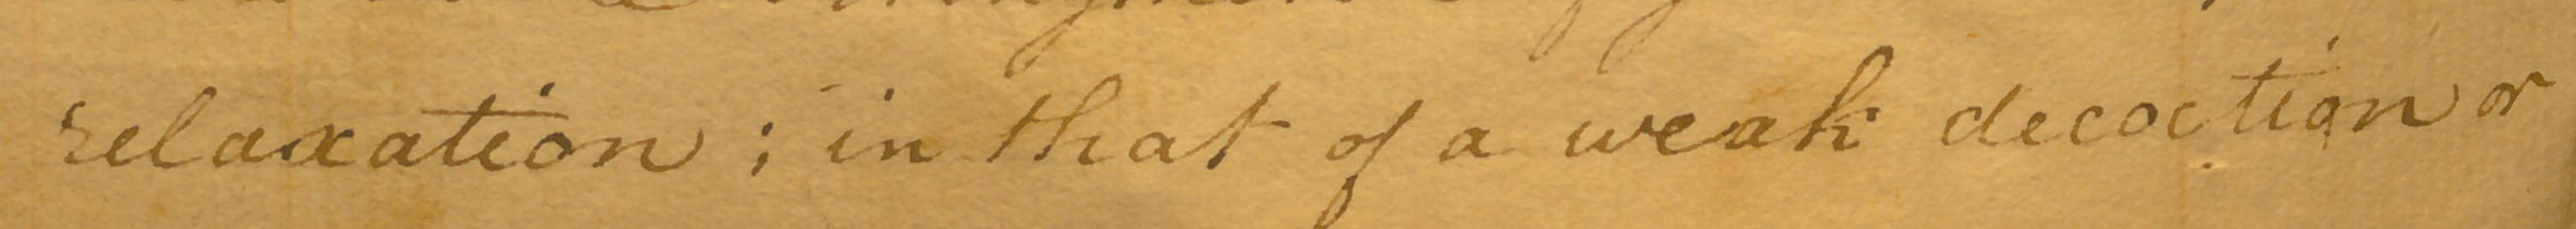relaxation; in that of a weak decoction or
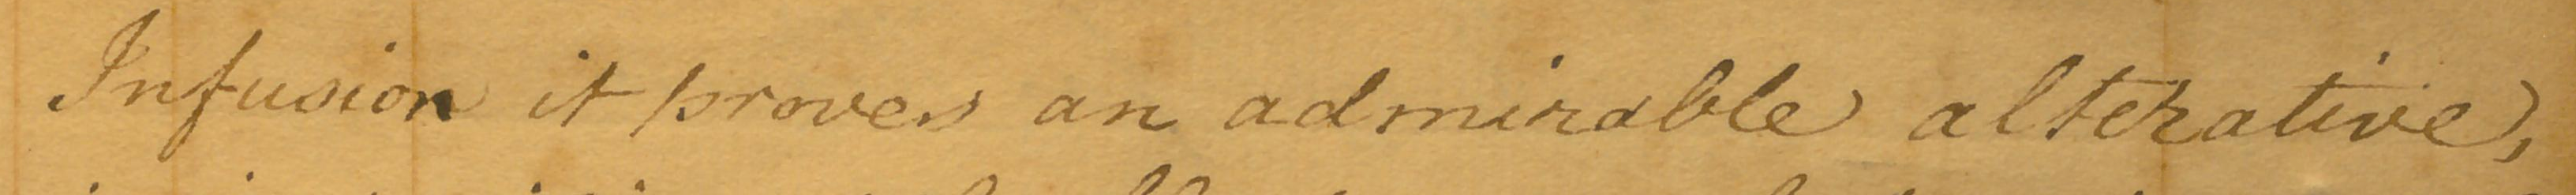Infusion it proves an admirable alternative,
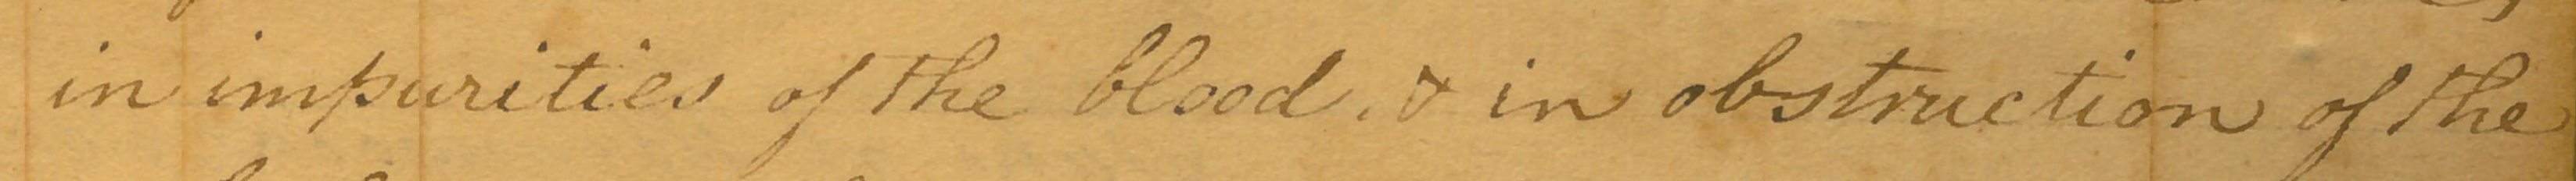in impurities of the blood, & in obstructions of the
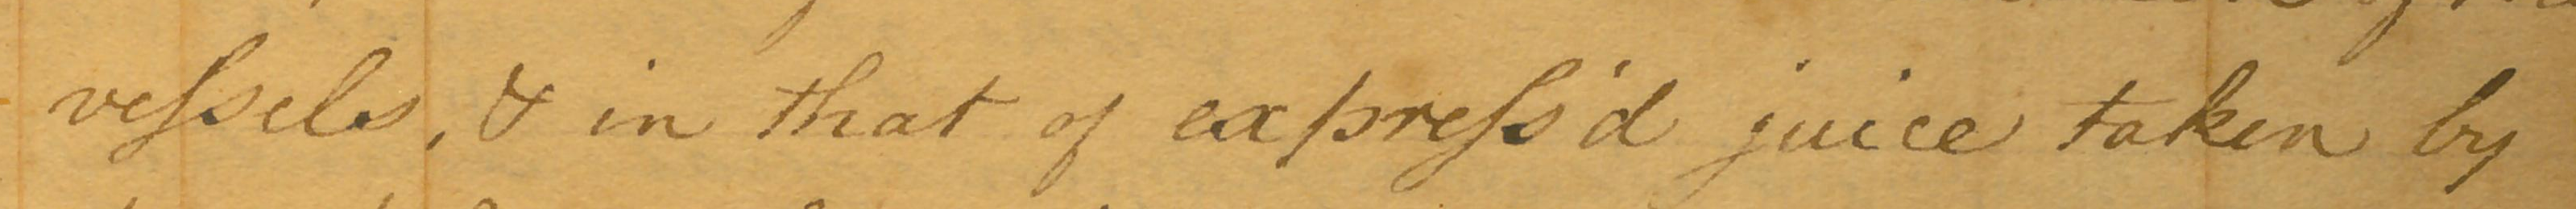vessels, & in that of express'd juice taken by
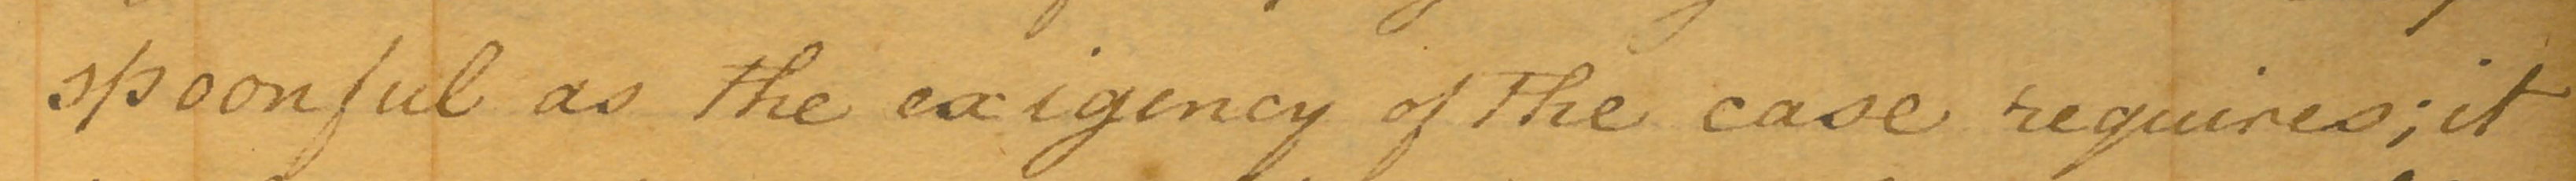spoonful as the exigency of the case requires; it
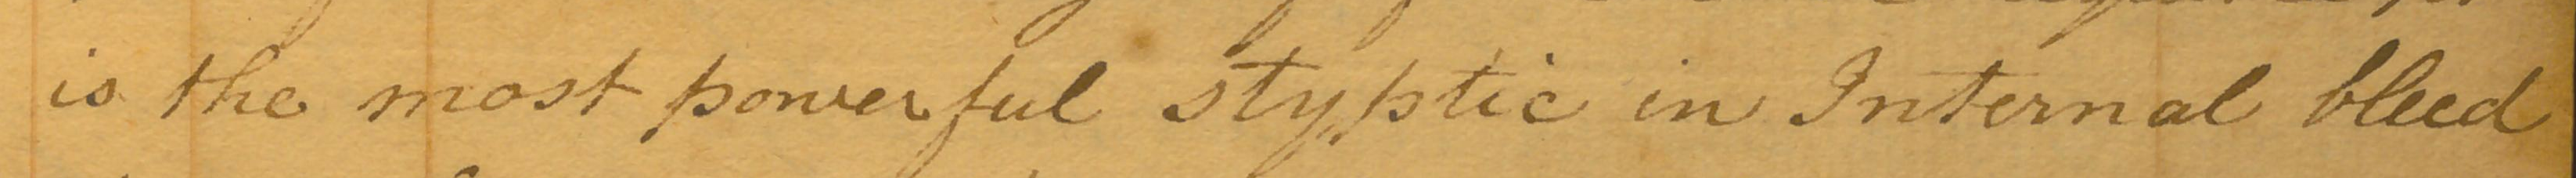is the most powerful styptic in Internal bleed
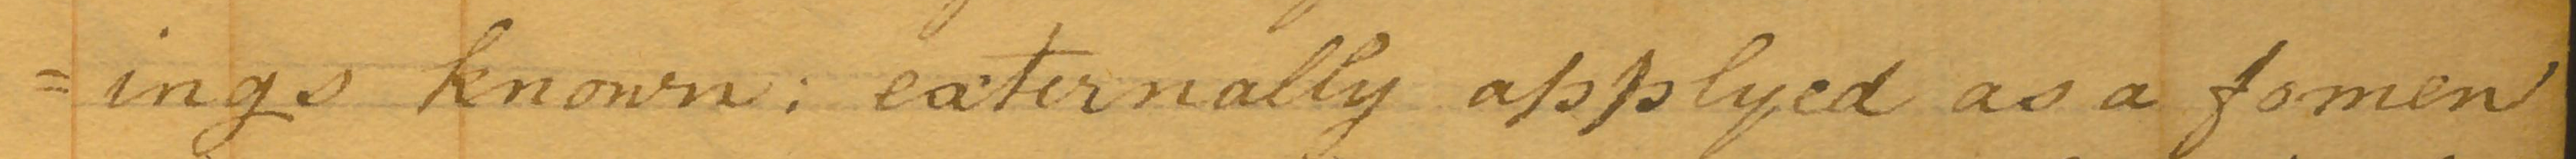-ings known; externally applyed as a formen
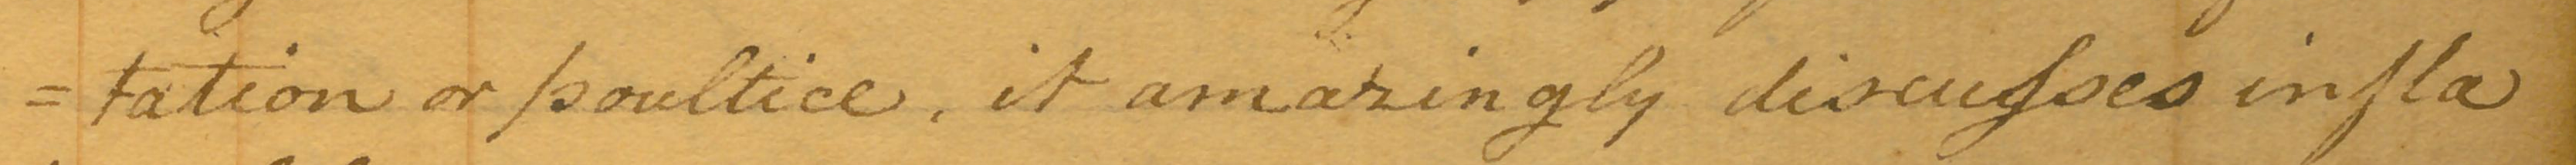-tation or poultice, it amazingly discusses infla
